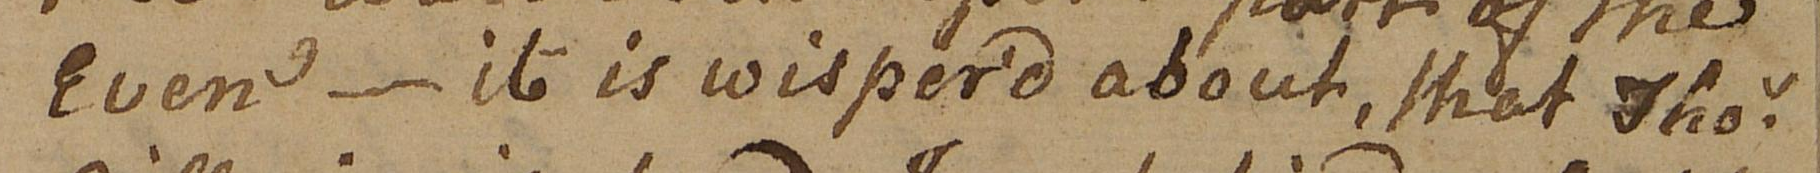Even^g- it is wisper'd about, that Tho^s.
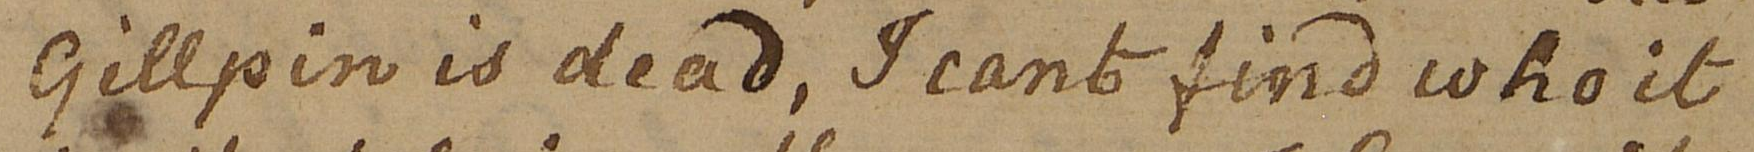Gillpin is dead, I cant find who it
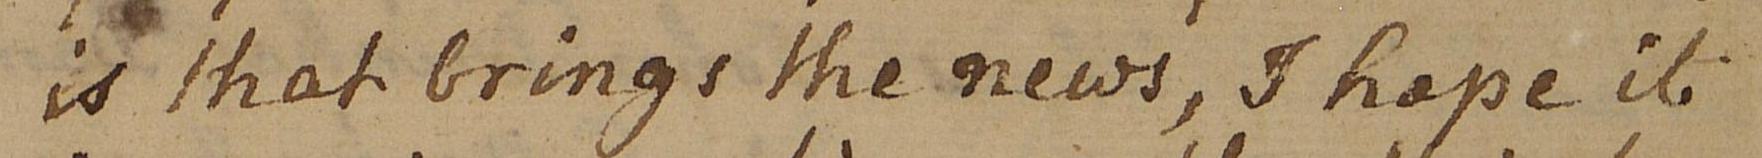is that brings the news, I hope it
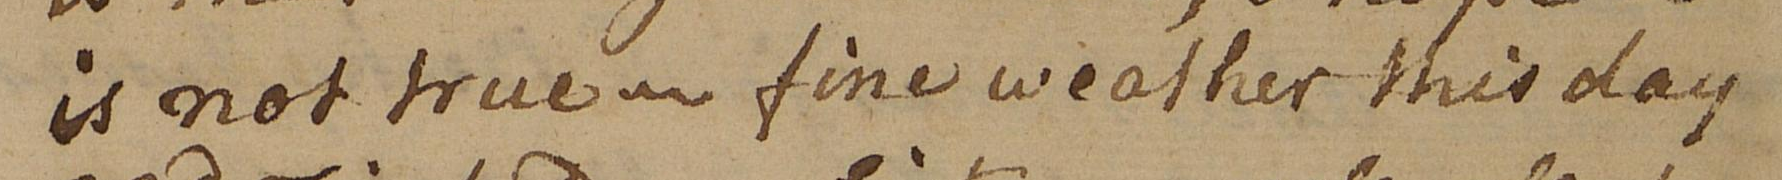is not true- fine weather this day
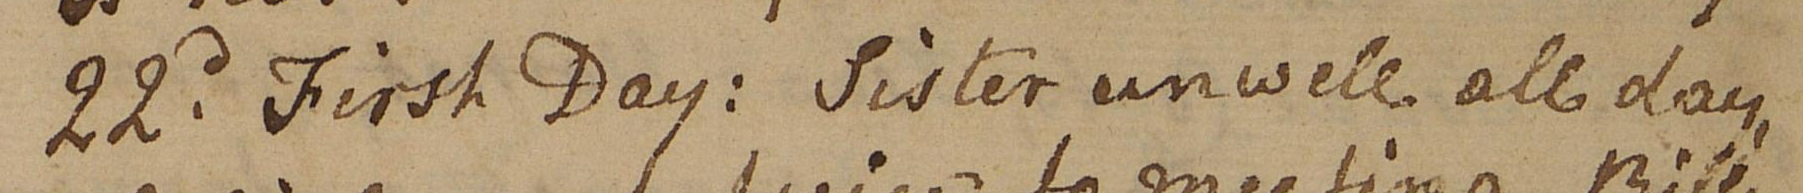22^d. First Day: Sister unwell all day,
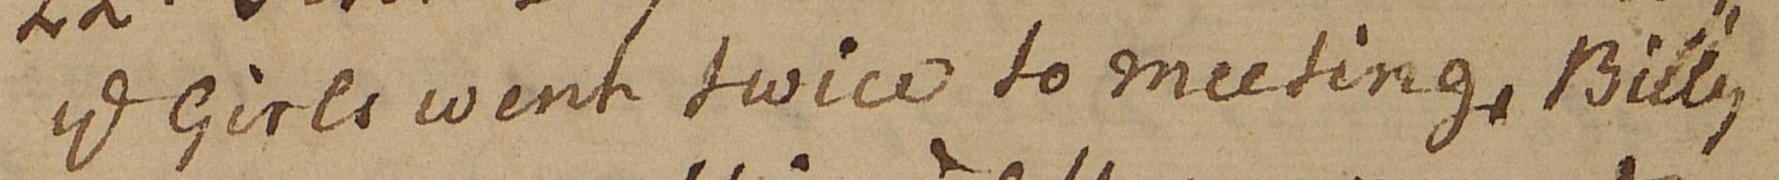y^e Girls went twice to meeting, Billy
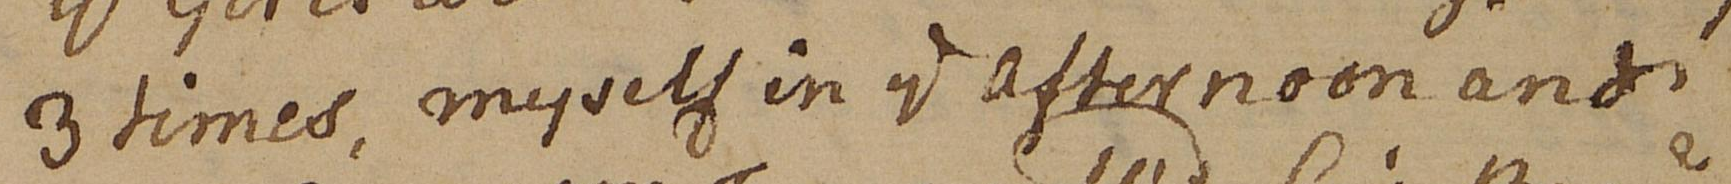3 times, myself in y^e afternoon and
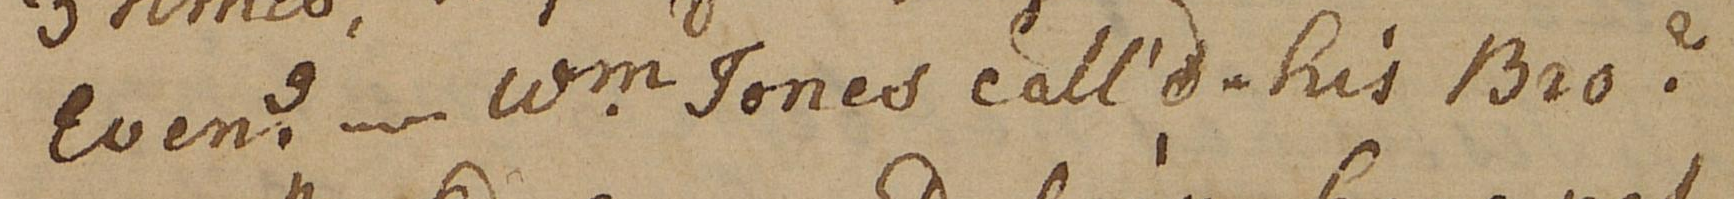Even^g.- W^m. Jones call'd- his Bro^r.
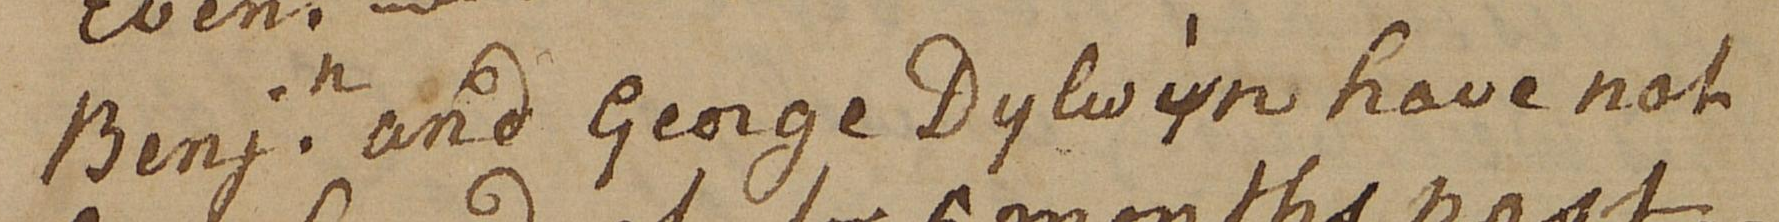Benj^n. and George Dylwyn have not
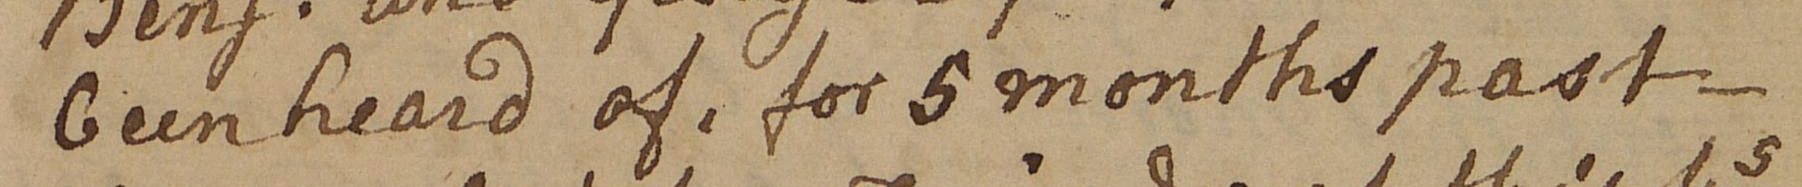been heard of, for 5 months past-
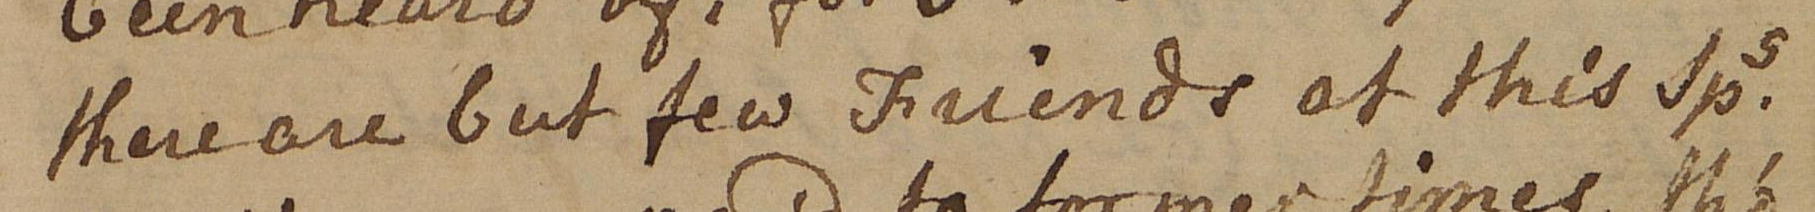there are but few Friends at this Sp^s.
